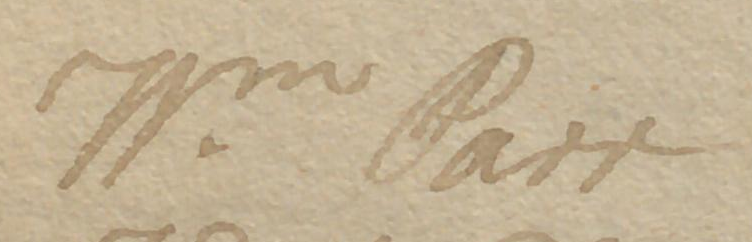W^m. Parr
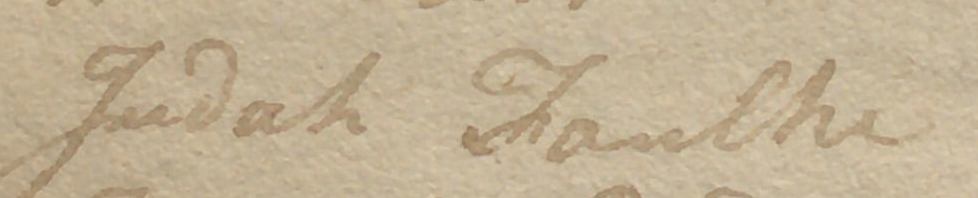Judah Foulke
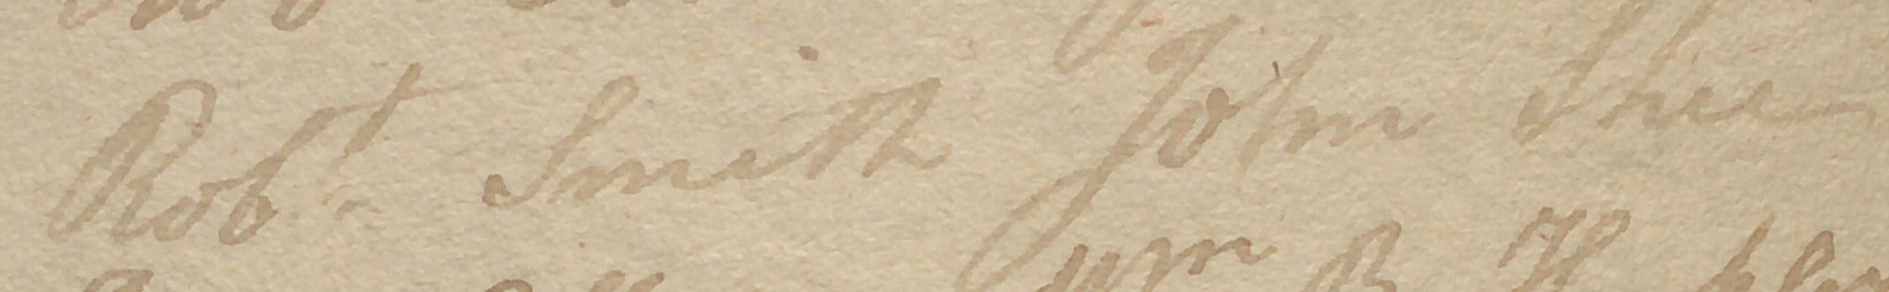Rob^t. Smith John Shee
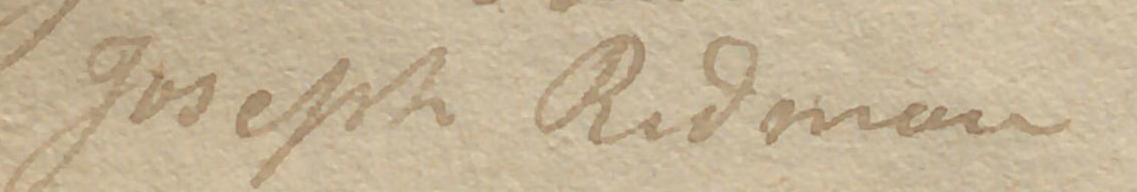Joseph Redman
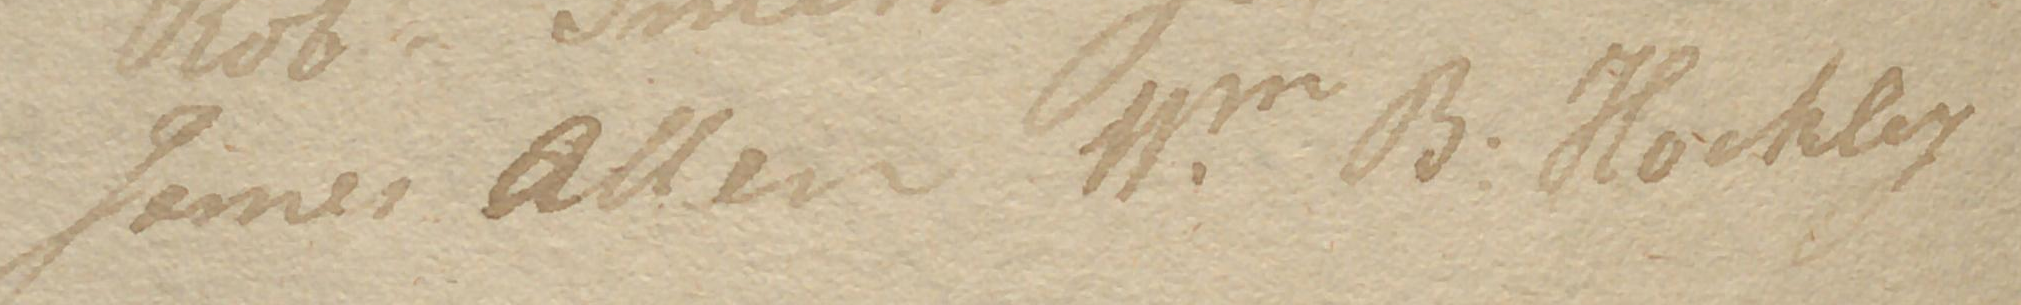James Allen W^m. B. Hockley
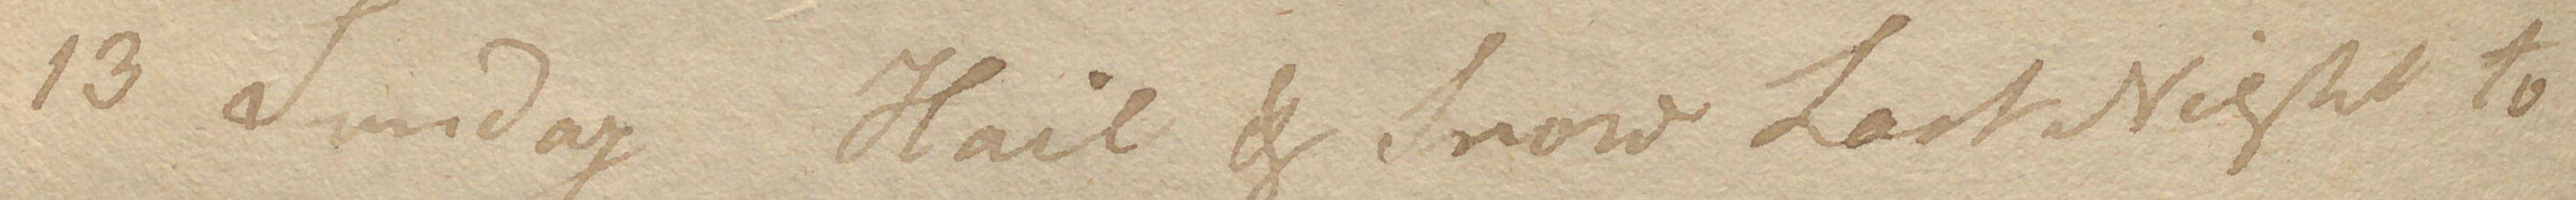13 Sunday Hail & Snow Last Night to
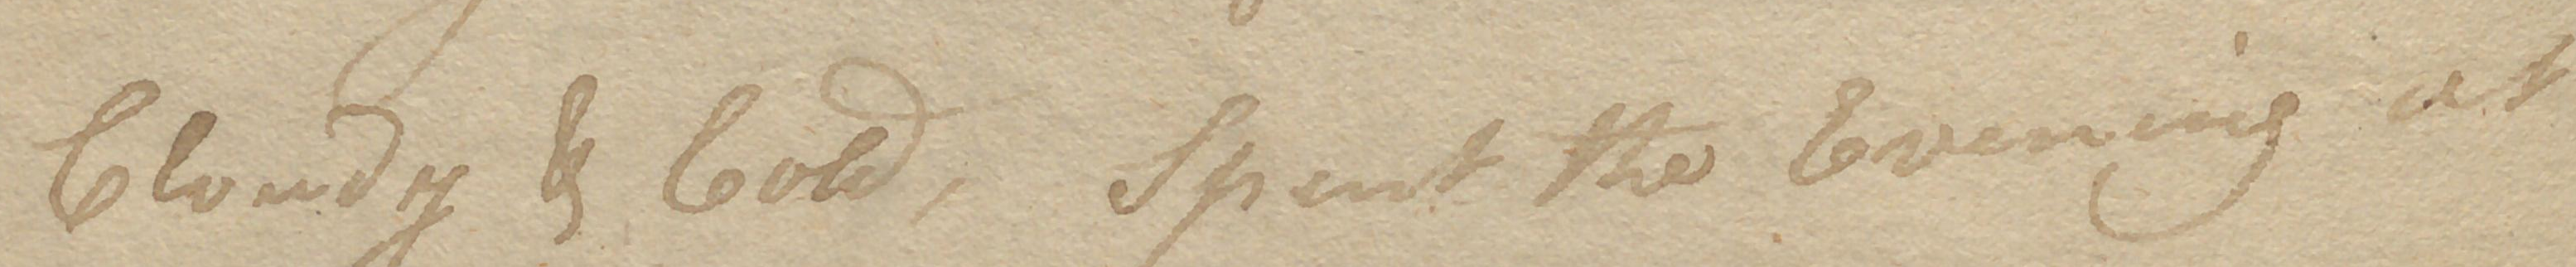Cloudy & Cold, Spent the Evening at
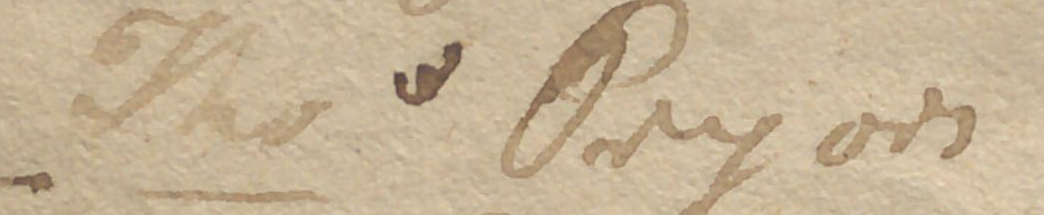Tho^s. Pryors
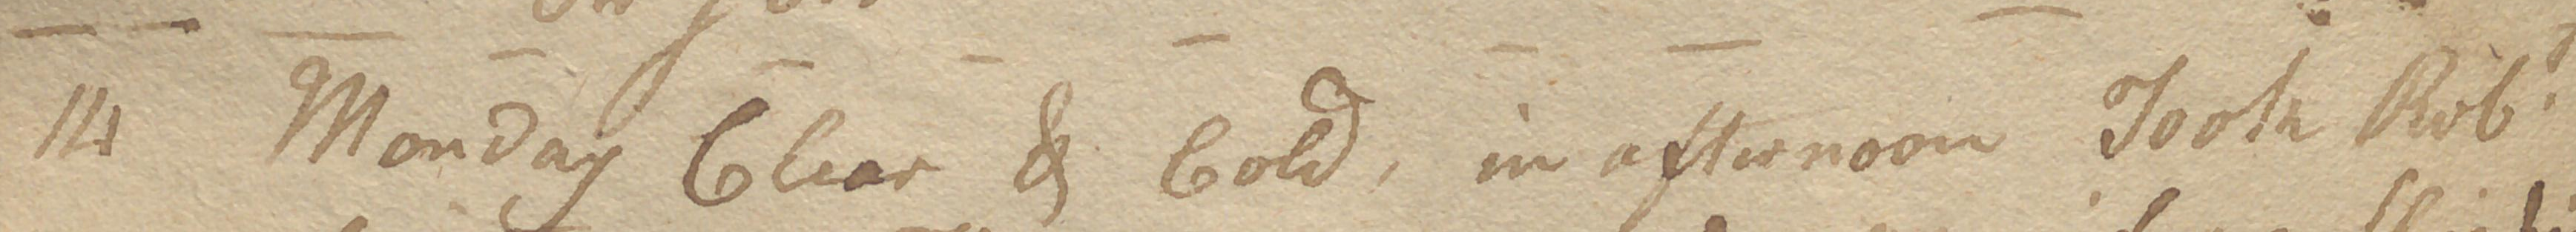14 Monday Clear & Cold, in a afternoon Took Rob^t.
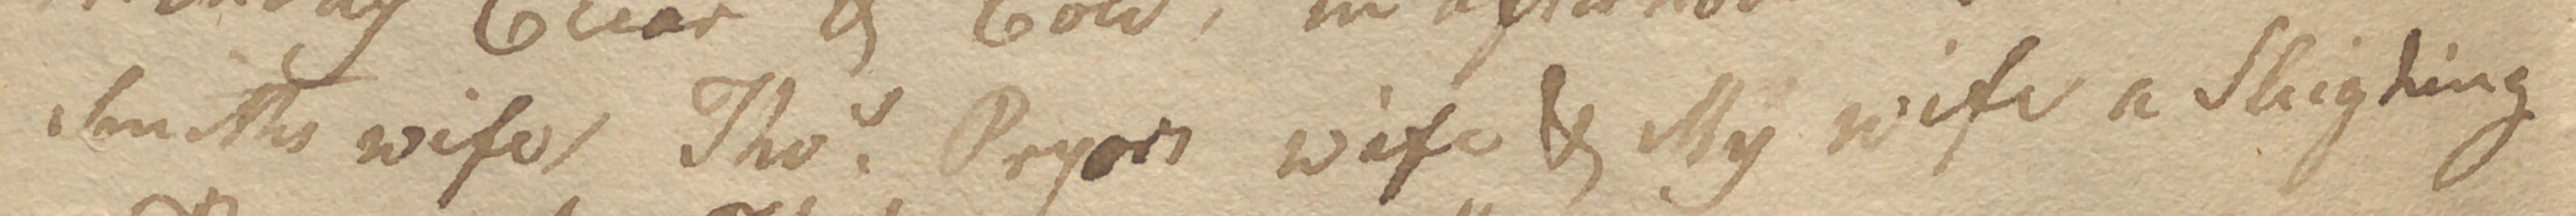Smiths wise Tho^s. Pryors wife & My wife a Sleighing
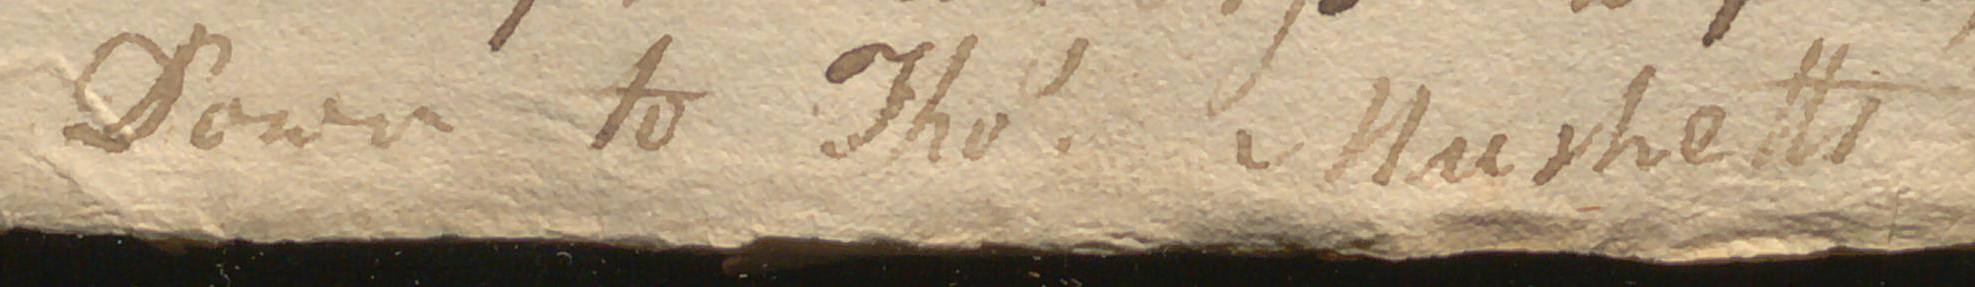Down to Tho^s. Mushetts
